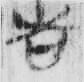告
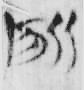所
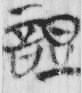䛠（囑）
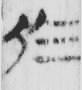於
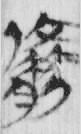{人衰肉刀}
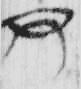尹
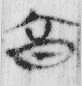亯
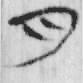月
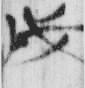戊
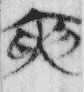寅
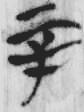辛
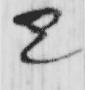巳
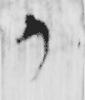人
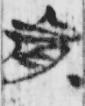前
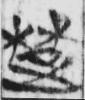楚
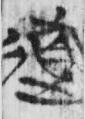○（前）
